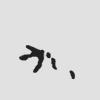九
